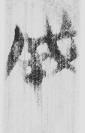成
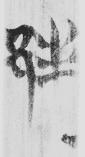邦
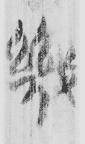幾
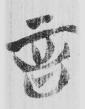言
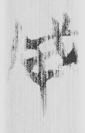成
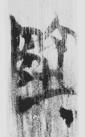地
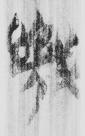幾
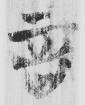言
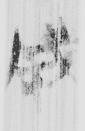成
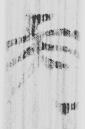天
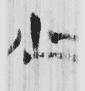少
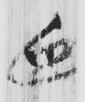臣
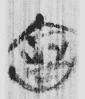合
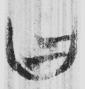曰
